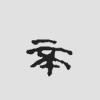不
